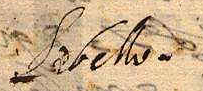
Libello
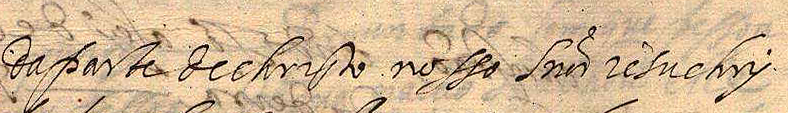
da parte de christo nosso Snor̄ iesu chris
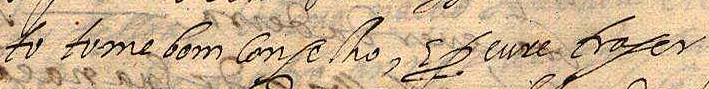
to tome bom conselho, E ꝓcure traser
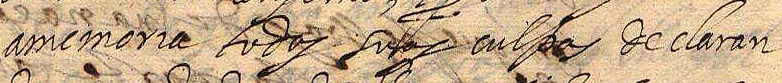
a memoria todas suas culpas declaran
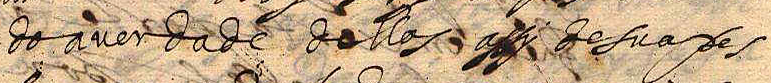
do a uerdade dellas assy de sua pes
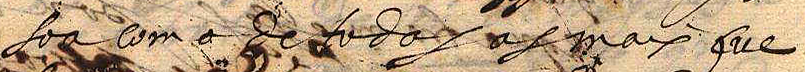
soa como de todas as mais que
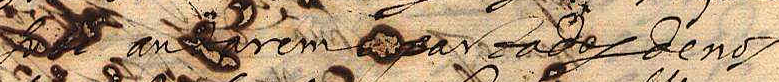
sabe andarem apartadas de nos
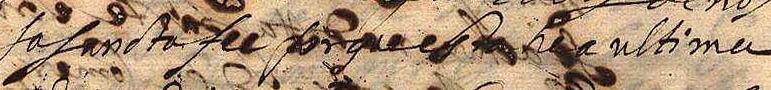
sa sancta fee porque esta he a ultima
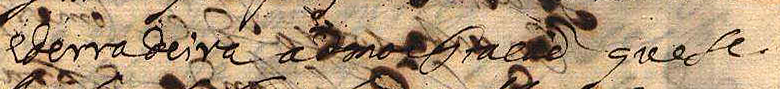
e derradeira admoestacaõ que se
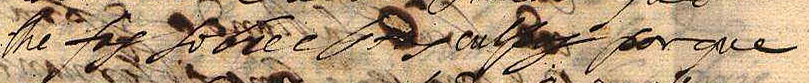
lhe fas sobre estas culpas porque
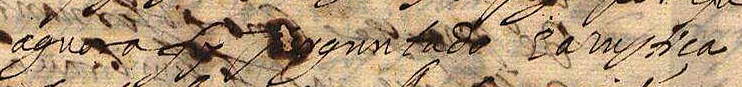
aguora foy perguntado E a iustiça
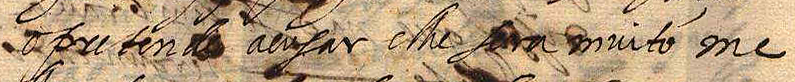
o pretende acusar e lhe sera muito me
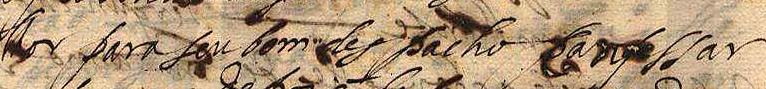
lhor para seu bom despacho Confessar
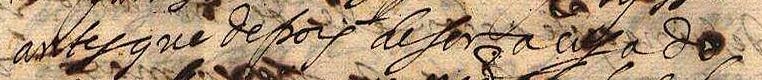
antes que depois de ser acusado
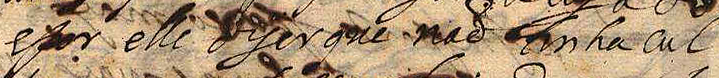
E por elle diser que naõ tinha cul
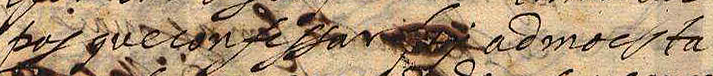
pas que confessar foj admoesta
